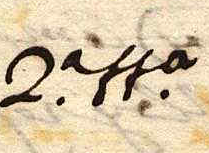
2.a tt.a
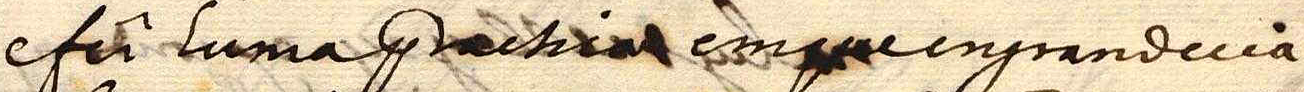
e fêz huma practica em que engrandecia
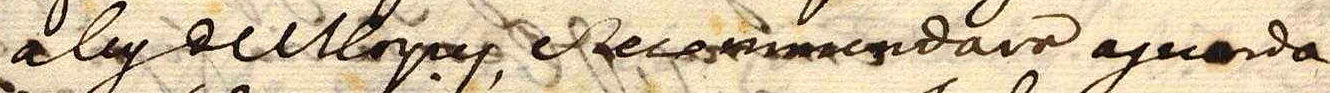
a ley de Moyzes, e Recommendava a guarda
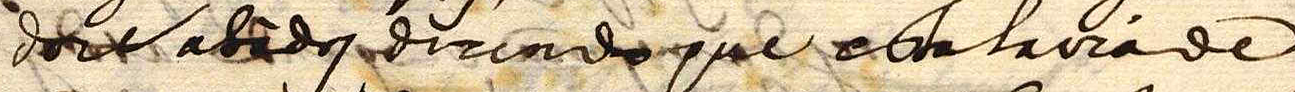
dos sabádos dizendo que esta havia de
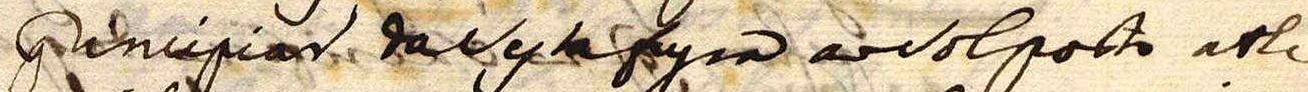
principiar da sesta feyra ao sol posto athe
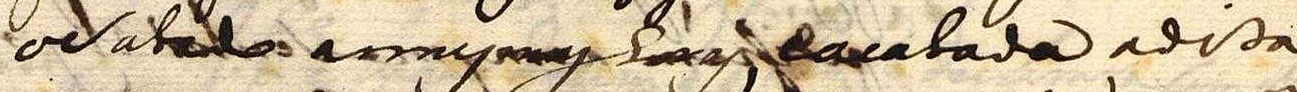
o sabado as mesmas horas, e acabada a dita
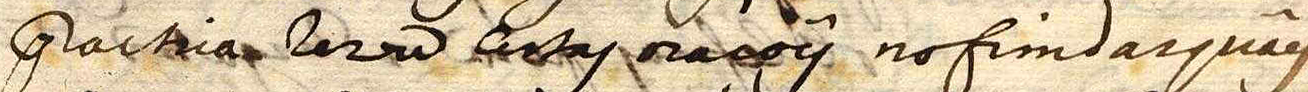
practica Rezou certas oraçoês no fim das quâes
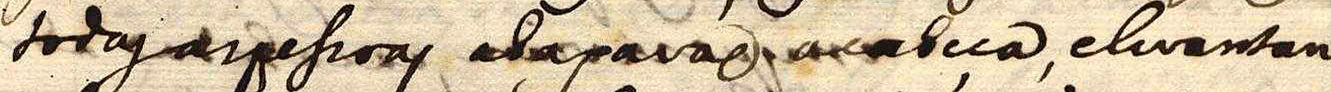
todas as pessoas abaxavão a cabeça, e levantan
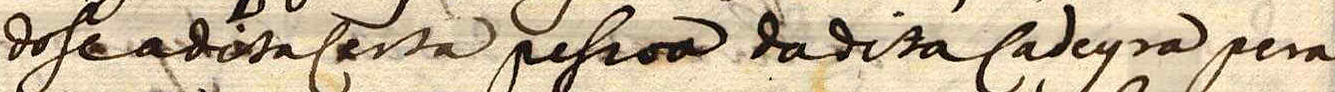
dose a dita Certa pessoa da dita Cadeyra pera
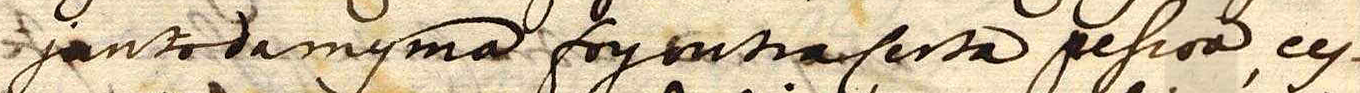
junto da mesma foy outra Certa pessoa, e es
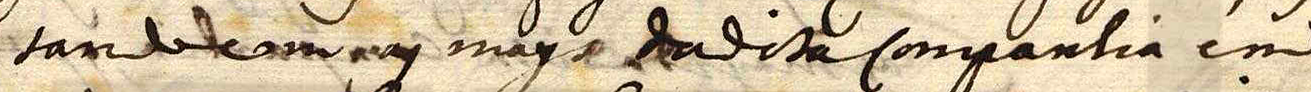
tando com as mays da dita Companhia em
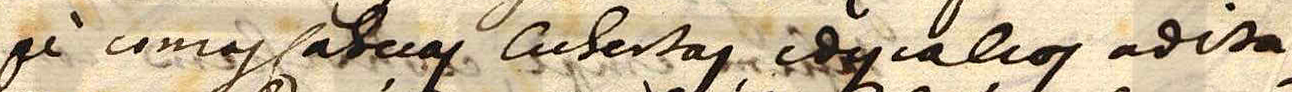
pé com as Cabeças Cubertas, e descalços a dita
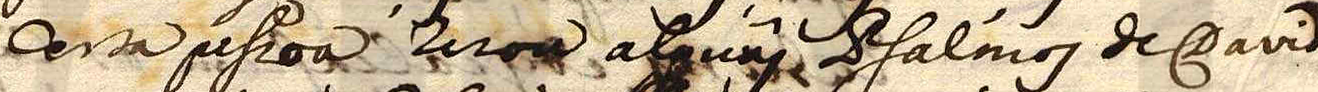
certa pessoa Rezou alguñs Psalmos de David
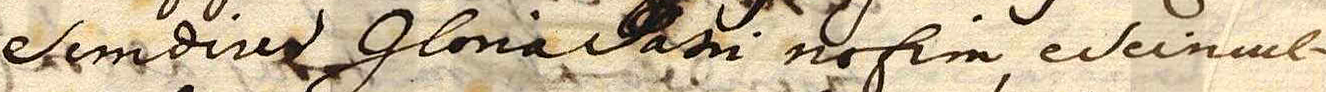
sem dizer Gloria Patri no fim, e se incul
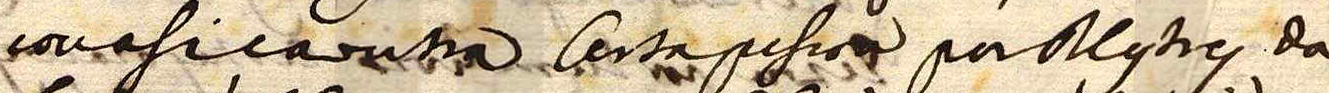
cou asi, e a outra Certa pessoa por Mestres da
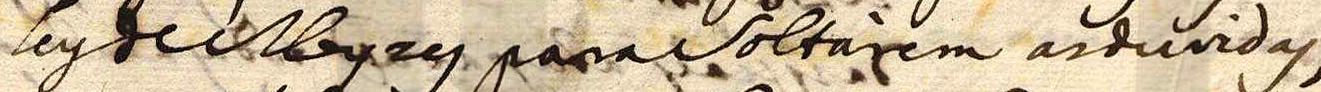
Ley de Moyzes para soltárem as duvidas,
